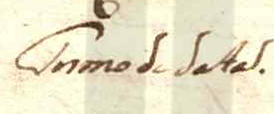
Termo de data.
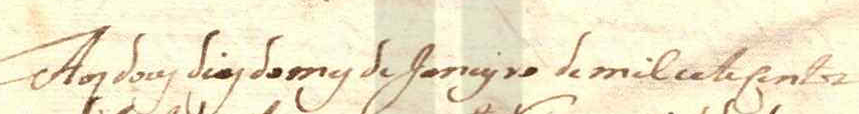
Aos dous dias do mes de Janeyro de mil ceteCentoz
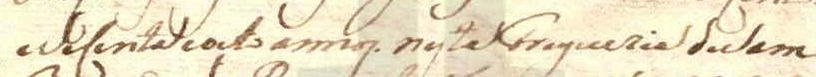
e SeCenta e oito annos nesta Freguezia de sam
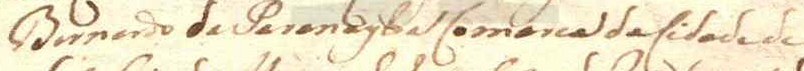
Bernardo da Paranayba Comarca da Cidade de
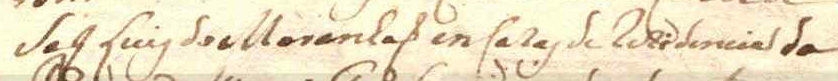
Saõ Luis do Maranhaõ en Cazas de Rezidencia do
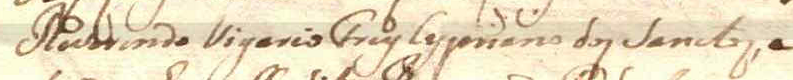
Reuerendo Vigario Frey Cypriano dos Sanctos, e
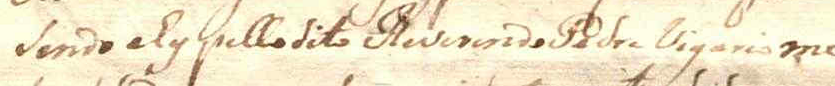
sendo ahy pello dito Reverendo Padre Vigario me
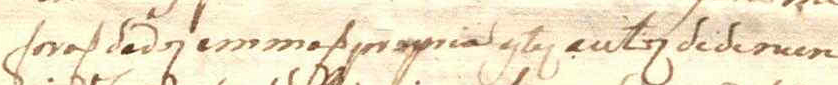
foraõ dados em maõ propria estes autos de denun
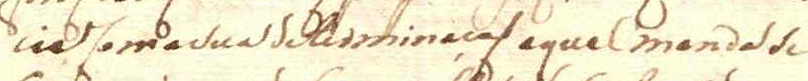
cia Com a sua determinaçaõ a qual manda se
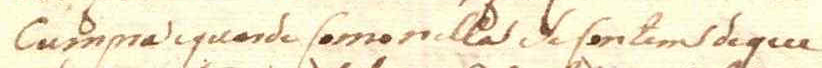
Cumpra e guarde Como nella se Contem de que
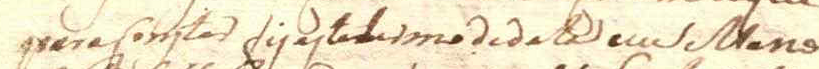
para Constar fis este termo de data eu Mano
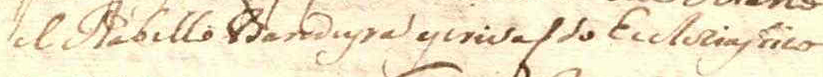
el Rabello Bandeyra escrivaõ do Eccleziastico
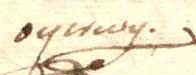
o escrevy.
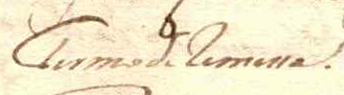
Termo de Remessa.
